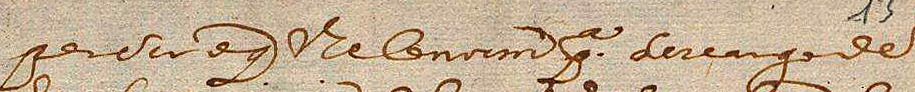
por ser o q̄ lhe Convem p.a descargo de
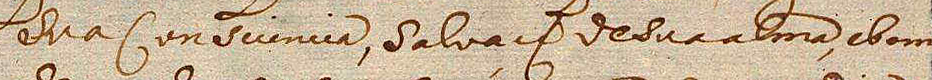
sua Consciencia, salvaçaõ de sua alma, e bom
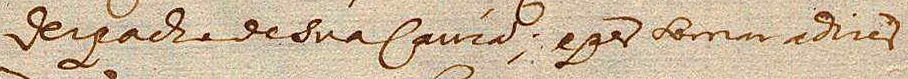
despacho de sua Cauza; e por tornar a dizer
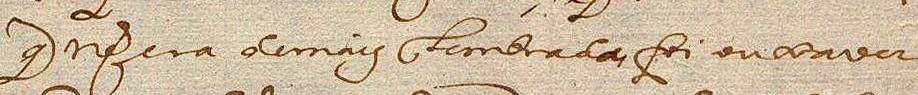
q̄ naõ era de mais lembrada, foi outra vez
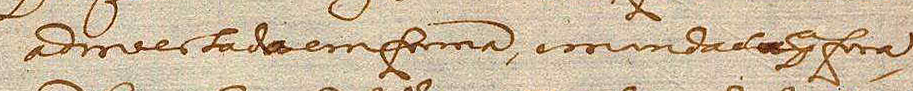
admoestada em forma, e mandada pa fora,
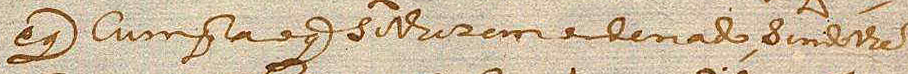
e q̄ CumpRa o q̄ se lhe tem ordenado, sendolhe
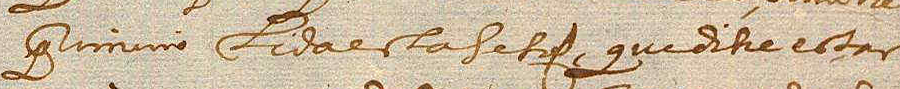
pRimeiro Lida esta sesaõ, que disse estar
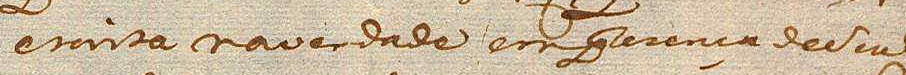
escrita na verdade em pRezença de seu
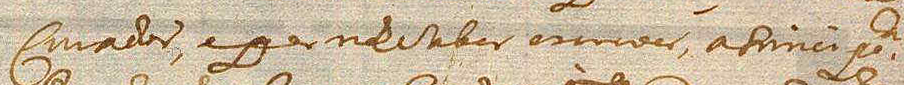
Curador, e por naõ saber escrever, assinei pe.la
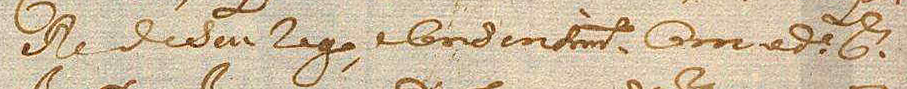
Re de Seu Rego, e Consentim.to Com o d.o s.r
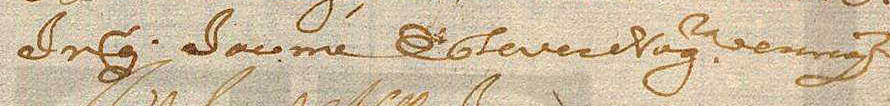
Inq.r Iacome Esteves Nogra. o escrivj
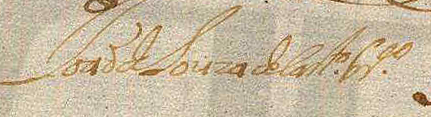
Ioaõ de Souza de Casto br.co
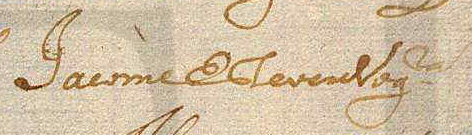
Iacome Esteven Nogra
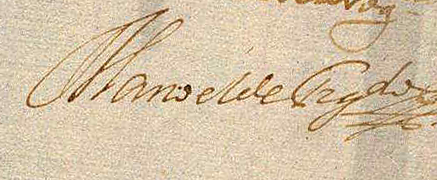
Manoel de Fig.do
